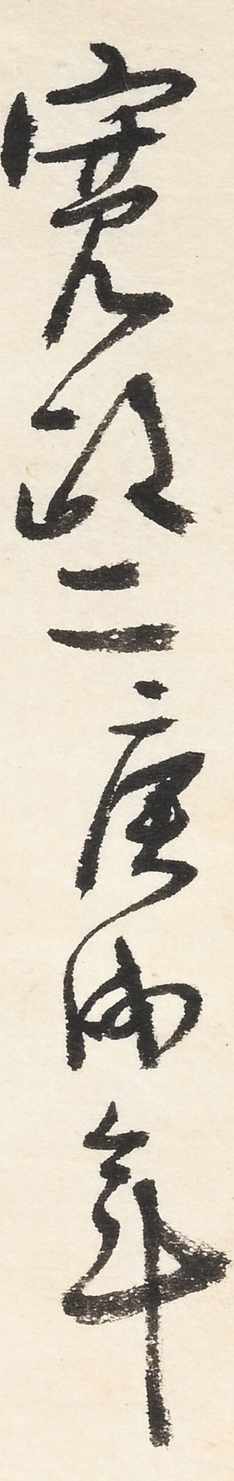寛政二庚戌年
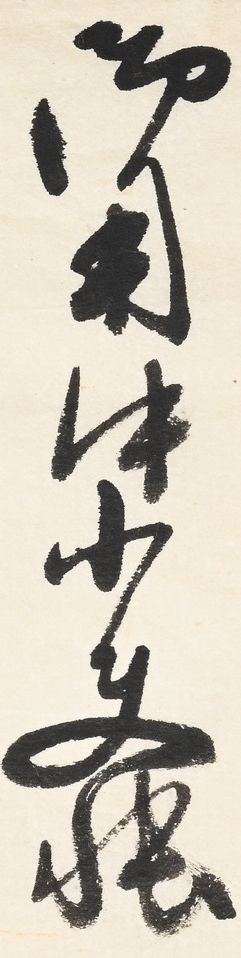御用中小夫帳
